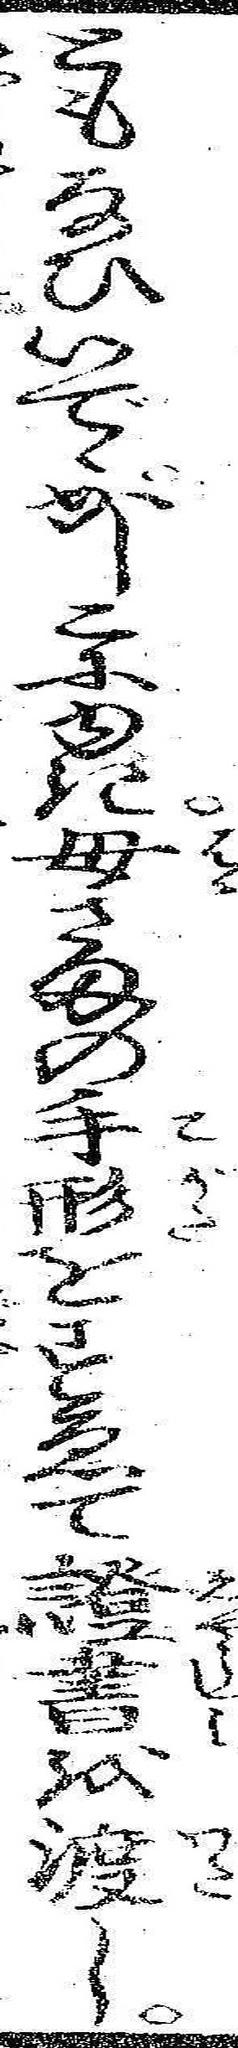ともなひいでゝ。かしこにゆき。母さまの手形をすゑて証書を渡し。
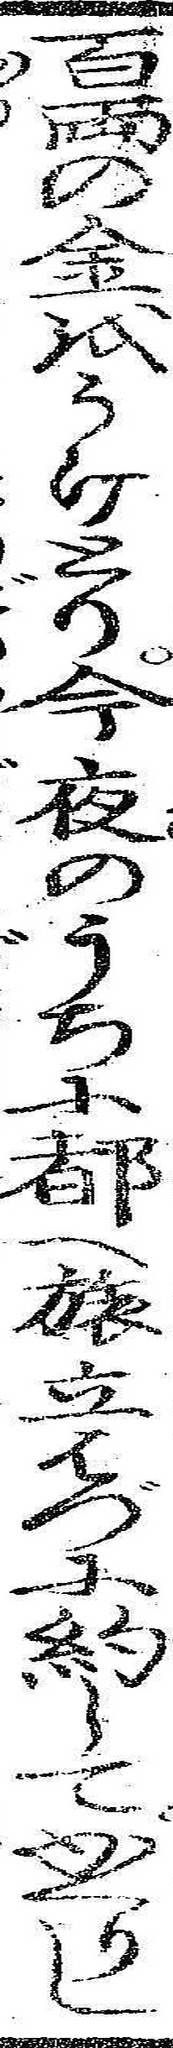百両の金をうけとり。今夜のうちに都へ旅立はづに約して。かへりし
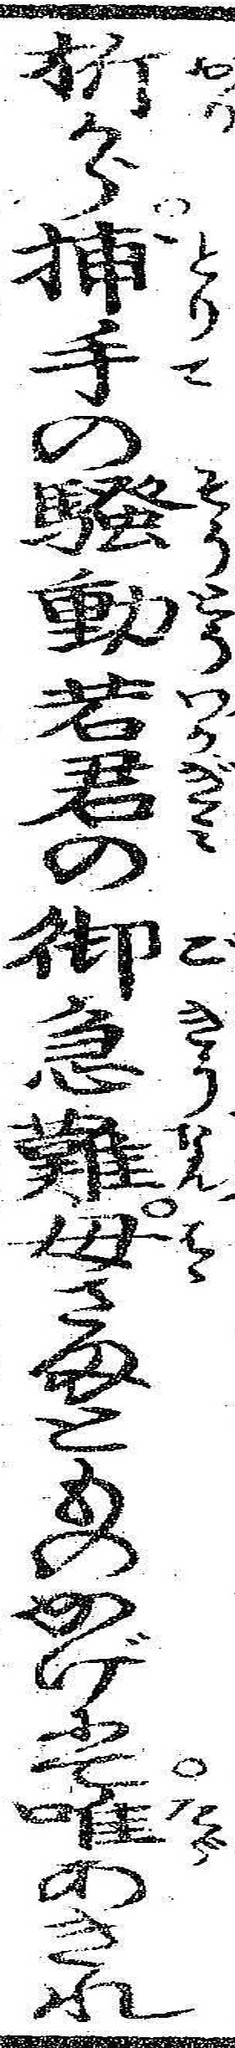折から。捕手の騒動若君の御急難。母さまとものかげにて。唯あきれ
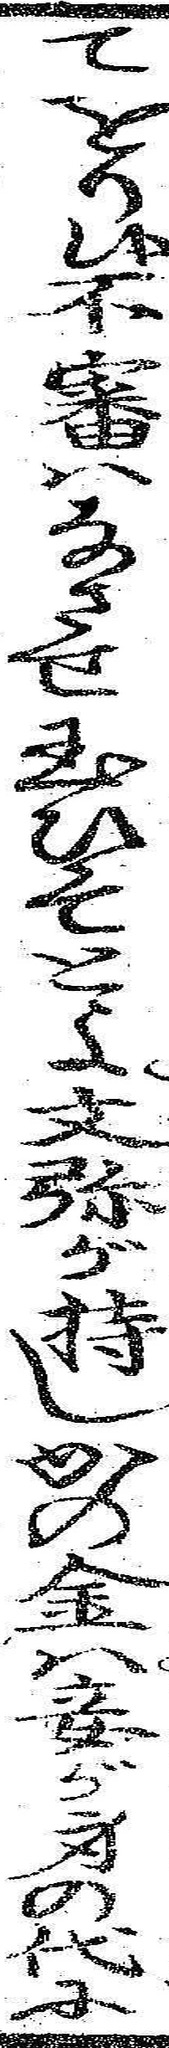てをり候。不審はなさせ玉ひそとよ。文弥が持しかの金は。妾が身の代に
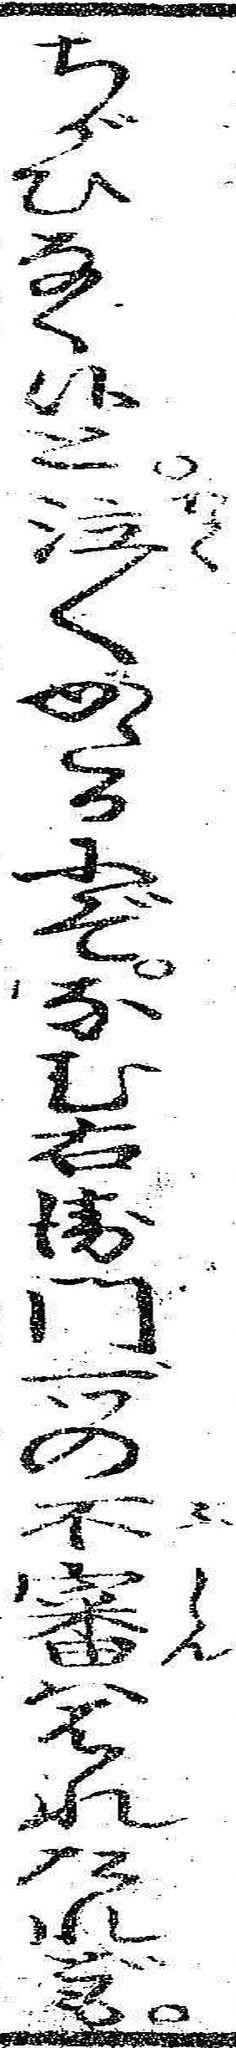ちがひなく候と。泣〳〵かたるにぞ。なむ右衛門一ツの不審ははれたれども。
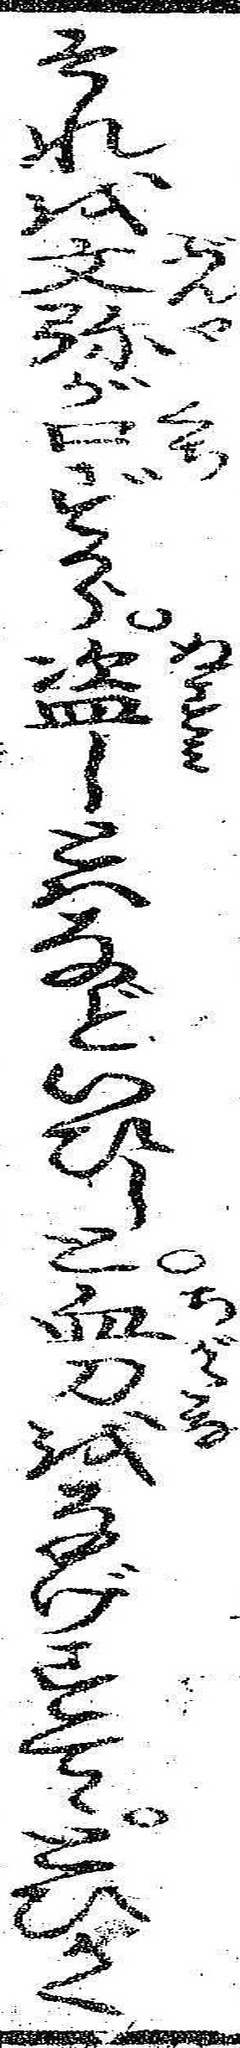それを文弥が口ずから。盗しとはなどいひしと。血刀をなげすてゝ。とひかゝ
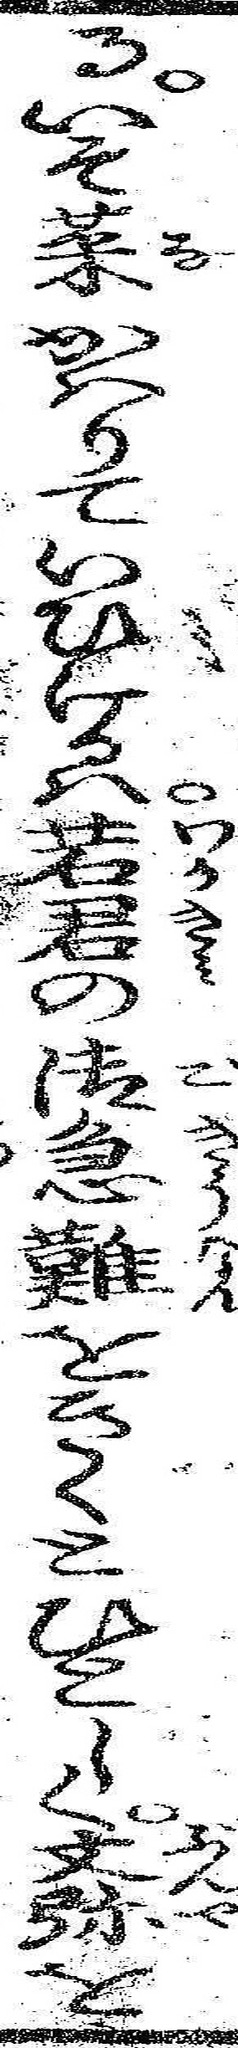る。いそ菜かはりていひけるは。若君の御急難をきくとひとしく。文弥を
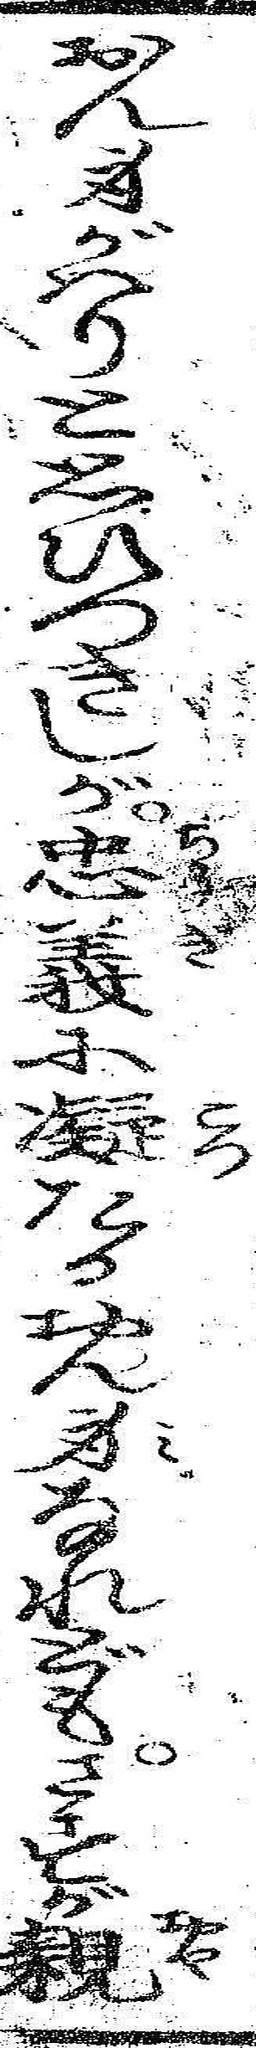おん身がはりと思ひつきしが。忠義に凝たるおん身なれども。さすが親

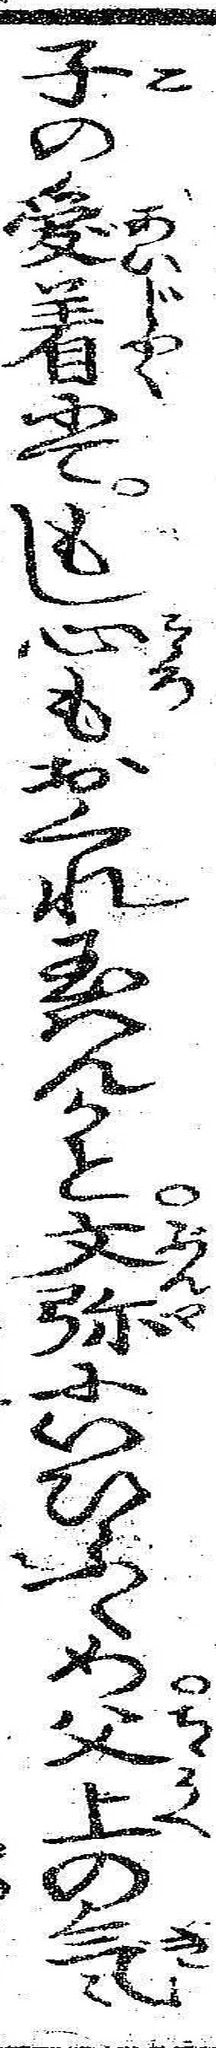子の愛着にて。もし心もおくれ玉はんかと。文弥にいひふくめ。父上の気
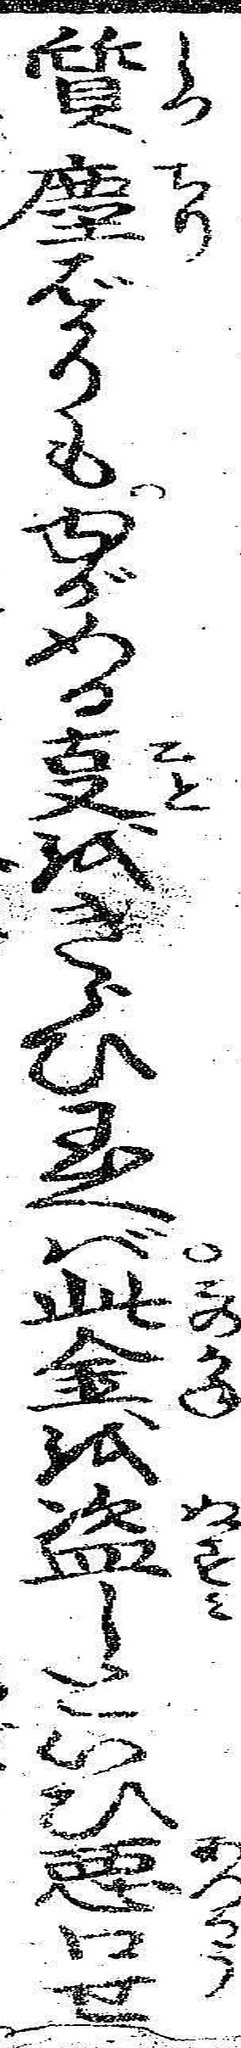質塵ばかりも。ゆがめる事をきらひ玉へば。此金を盗しといひ悪口せ
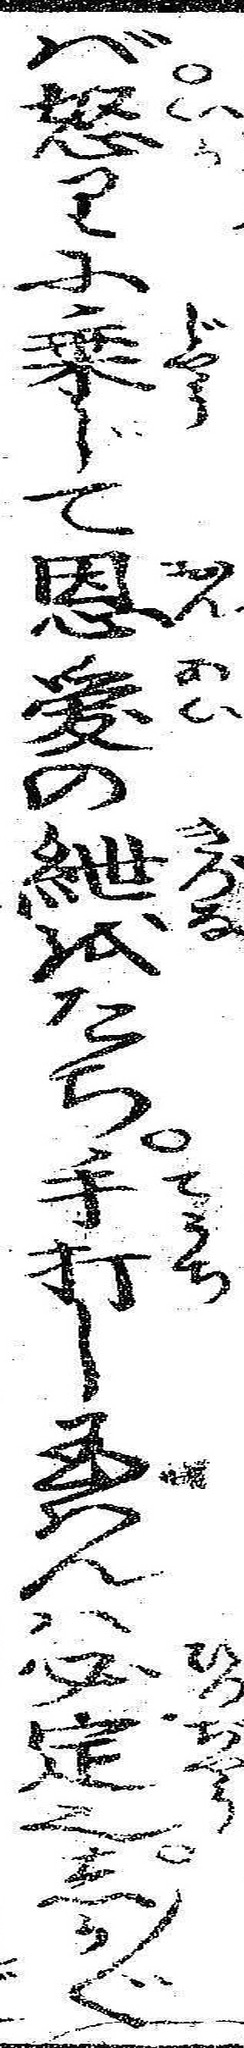ば。怒りに乗じて恩愛の紲をたち。手打し玉はんは必定也。しか〴〵
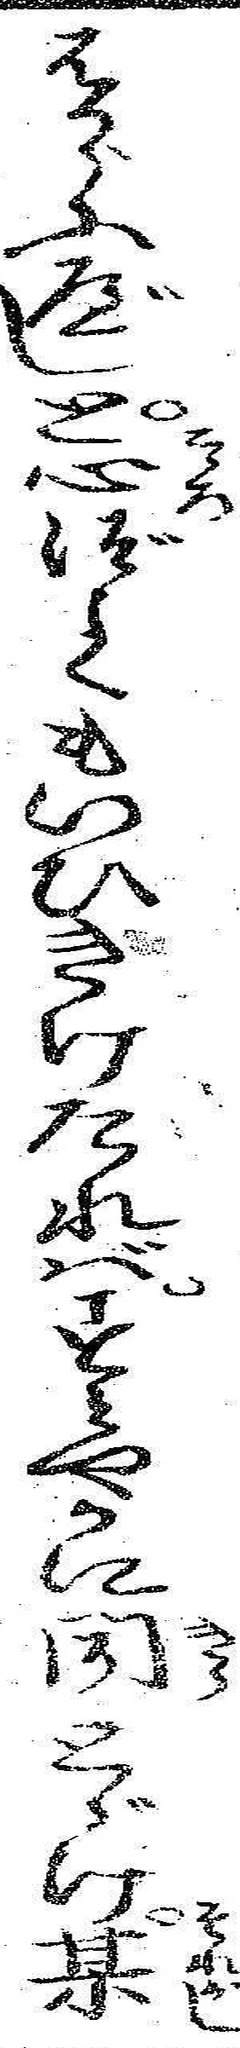はからふべし。と心づよくもいひきけたれば。すみやかに聞とゞけ。某
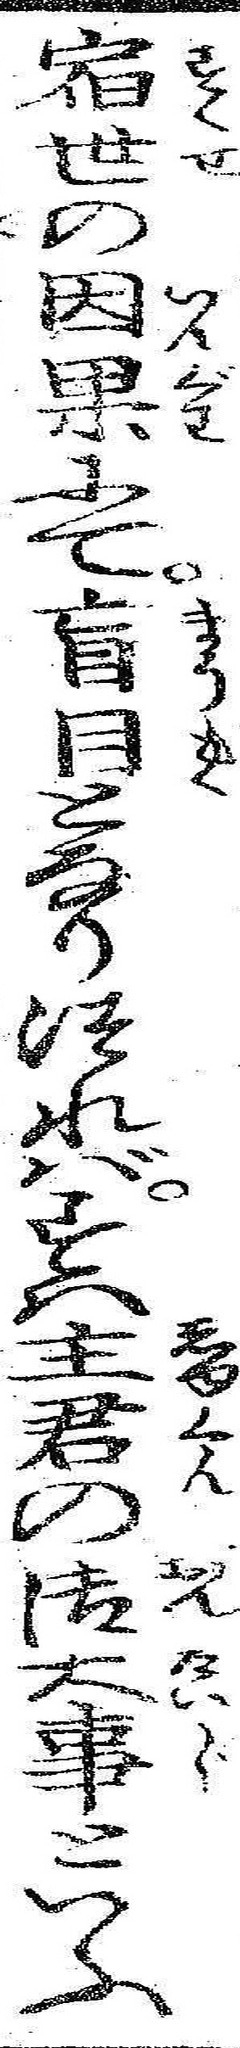宿世の因果にて。盲目となりつれば。すは主君の御大事といふ
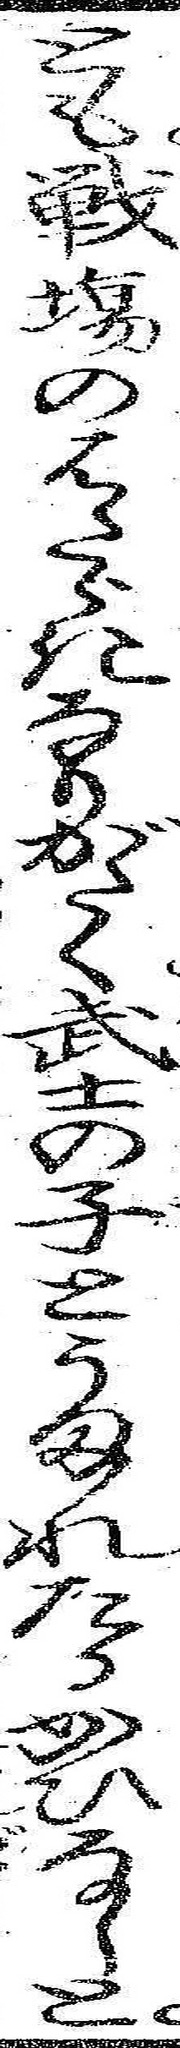とも。戦場のはたらきなりがたく。武士の子とうまれたるかひなしと。
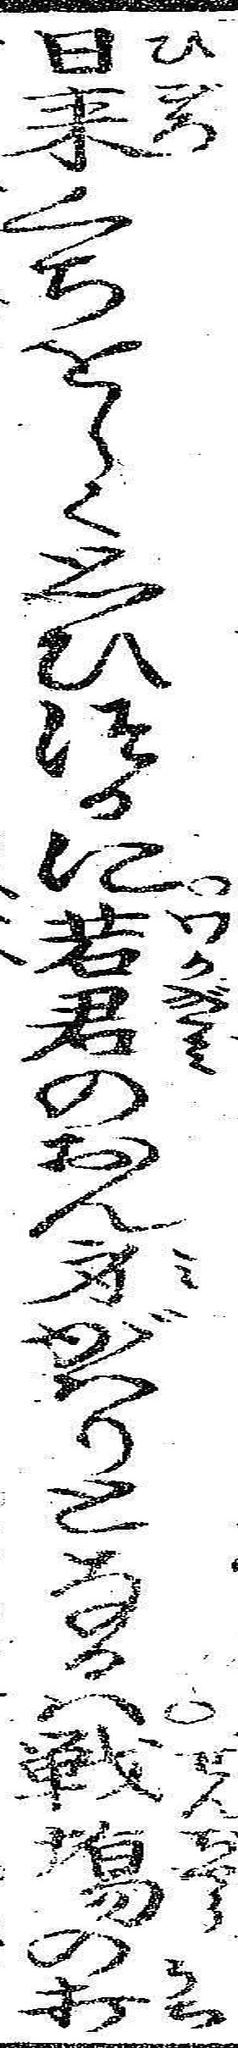日来くちをしく思ひつるに。若君のおん身がはりとなるは。戦場の打
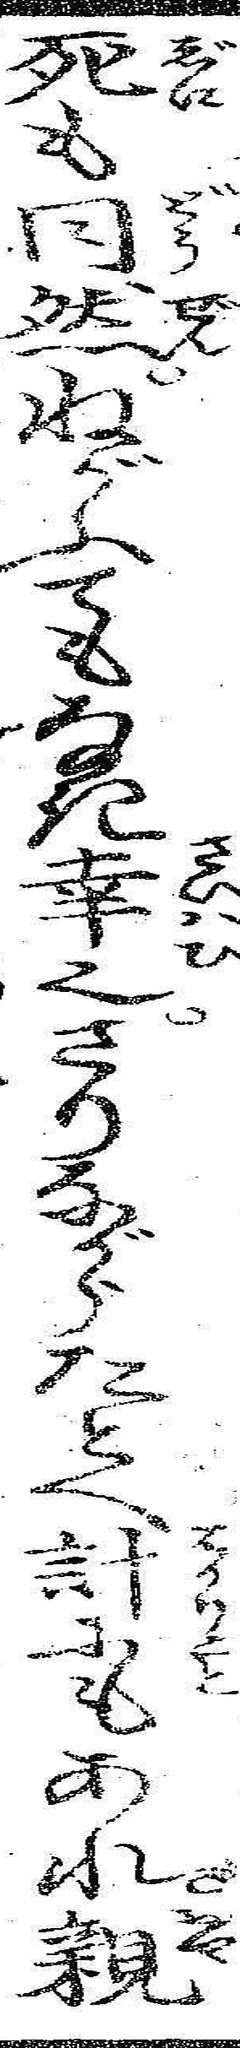死も同然。ねがふてもなき幸也。さりながらたとへ計にもあれ。親
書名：昔話稲妻表紙
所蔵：国文学研究資料館
